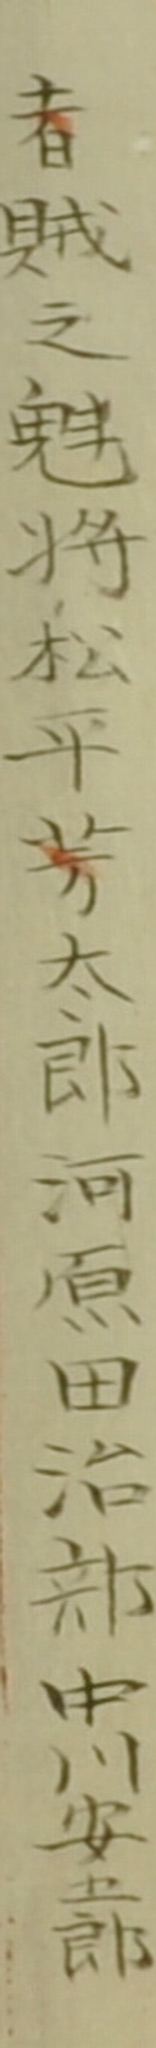者賊之魁将松平芳太郎河原田治部中川安五郎
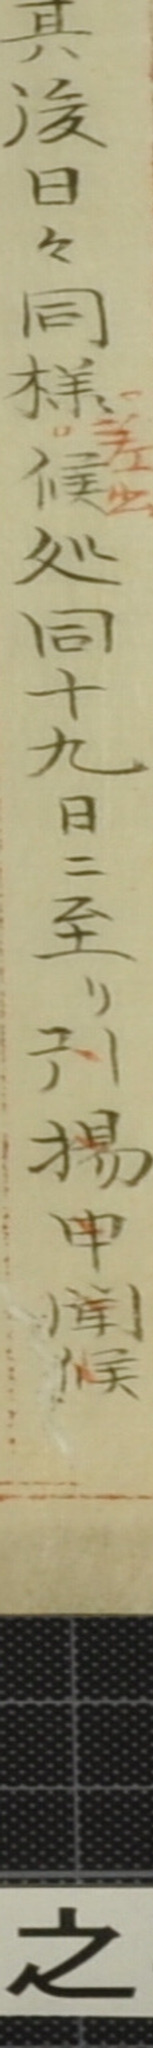其後日々同様差出候処同十九日ニ至リ引揚申聞候
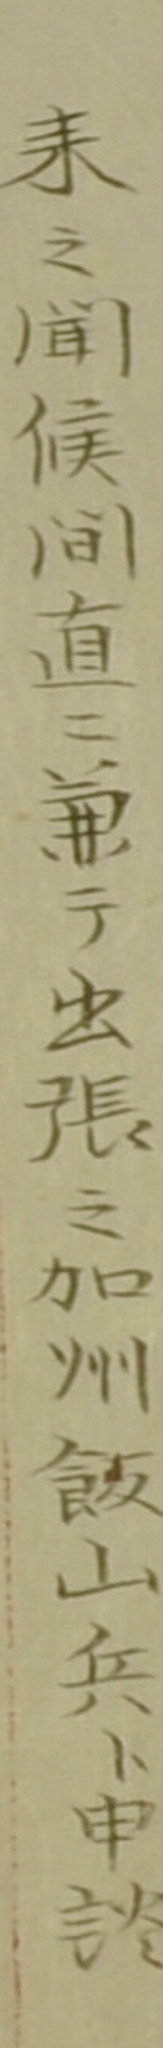来之聞候間直ニ兼テ出張之加州飯山兵ト申談
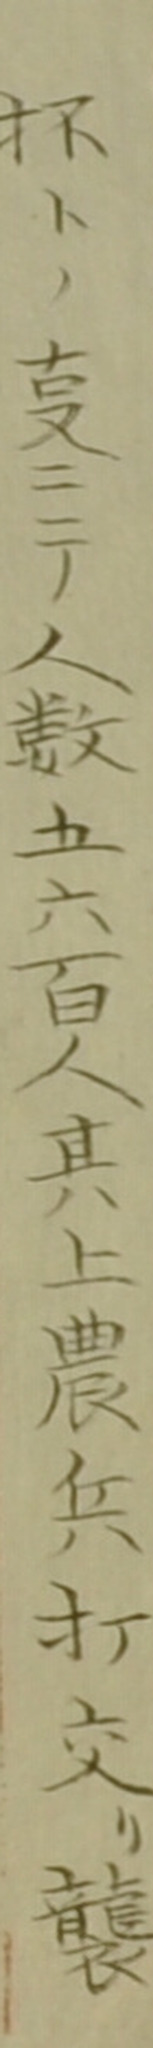抔トノ事ニテ人数五六百人其上農兵打交リ襲
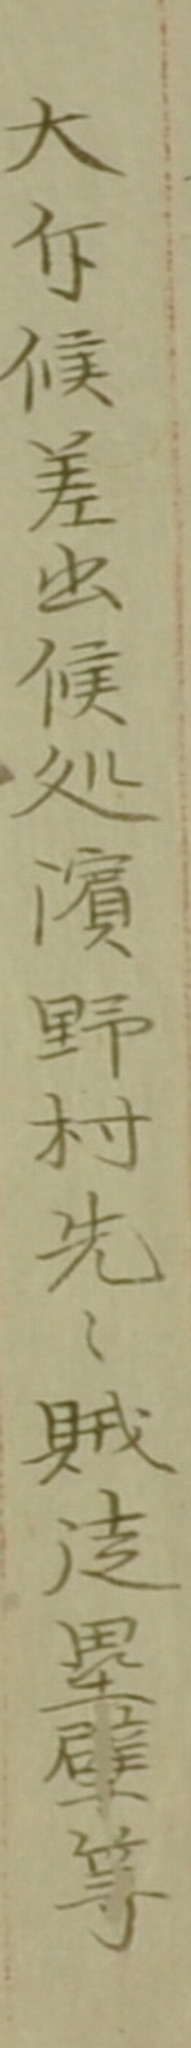大斥候差出候処浜野村先々賊徒塁壁等
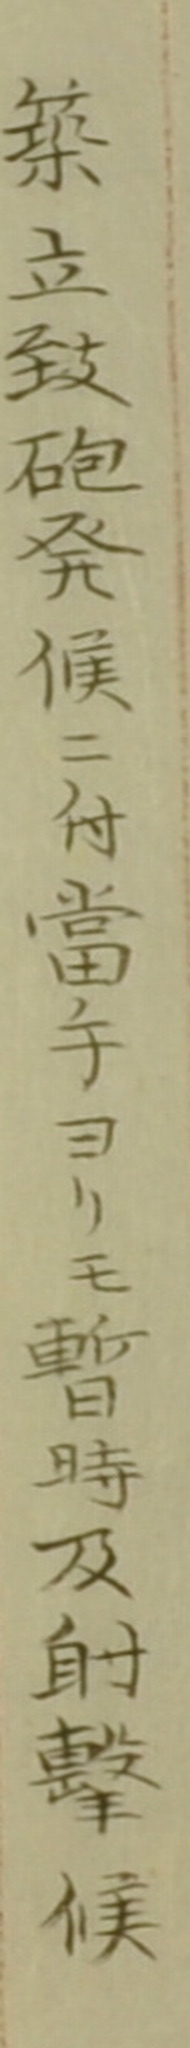築立致砲発候ニ付当手ヨリモ暫時及射撃候
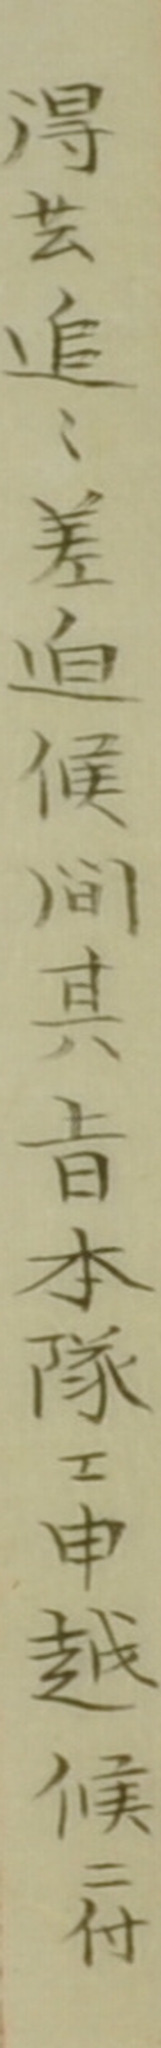得共追々差迫候間其旨本隊エ申越候ニ付
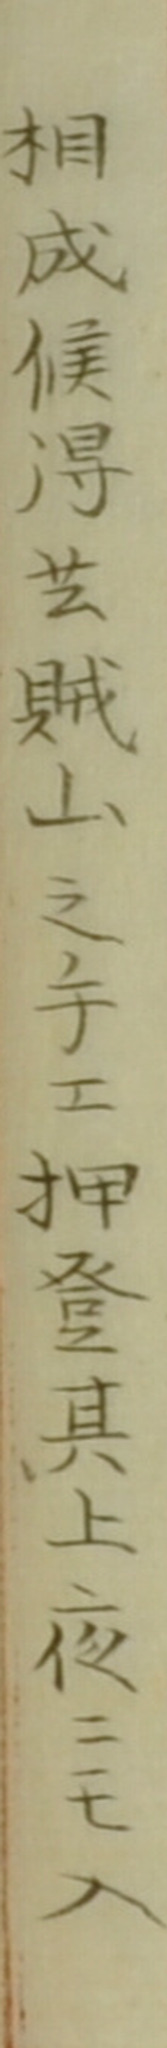相成候得共賊山之手エ押登其上夜ニモ入
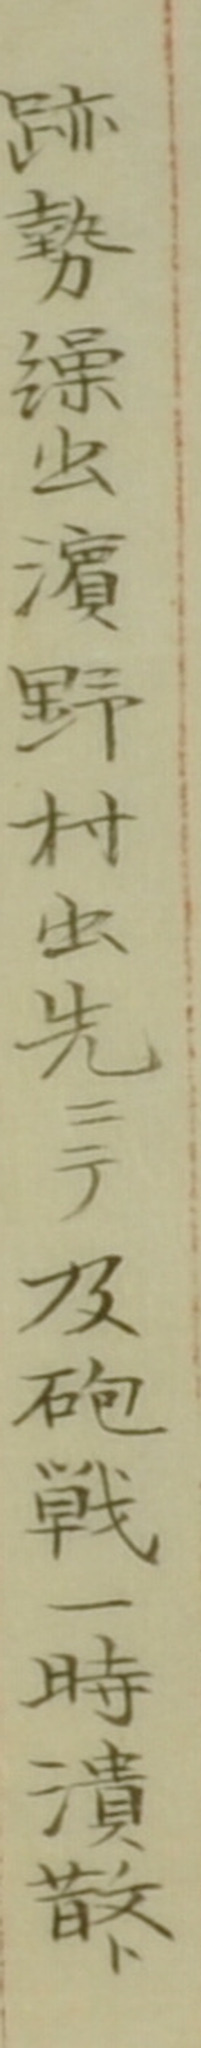跡勢繰出浜野村出先ニテ及砲戦一時潰散ト
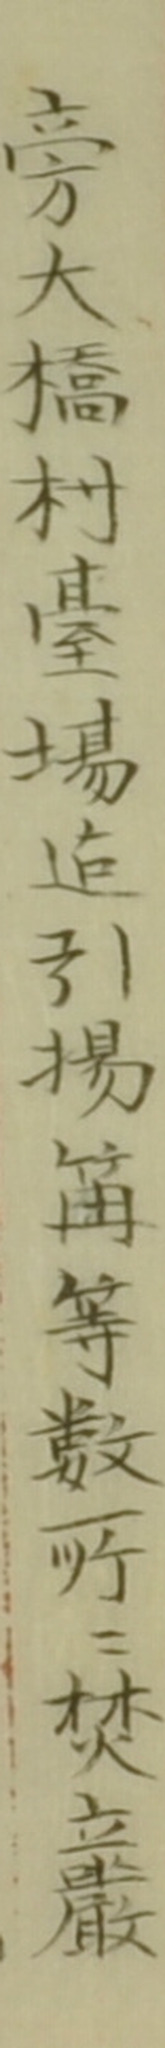旁大橋村台場迄引揚笧等数所ニ焚立厳
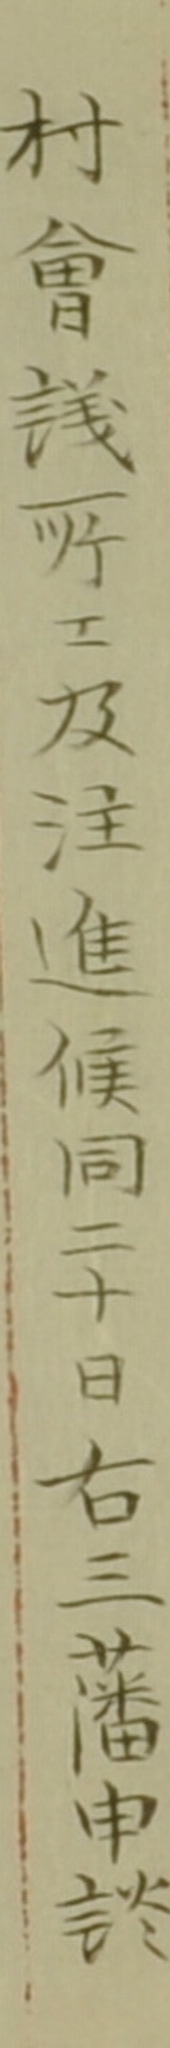村会議所エ及注進候同二十日右三藩申談
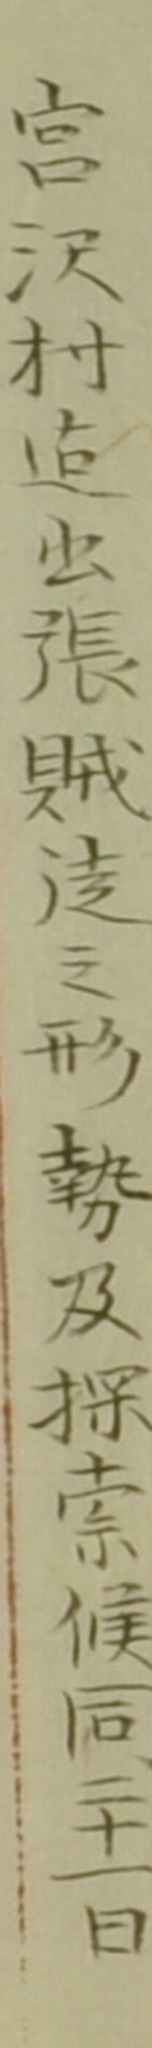宮沢村迄出張賊徒之形勢及探索候間二十一日
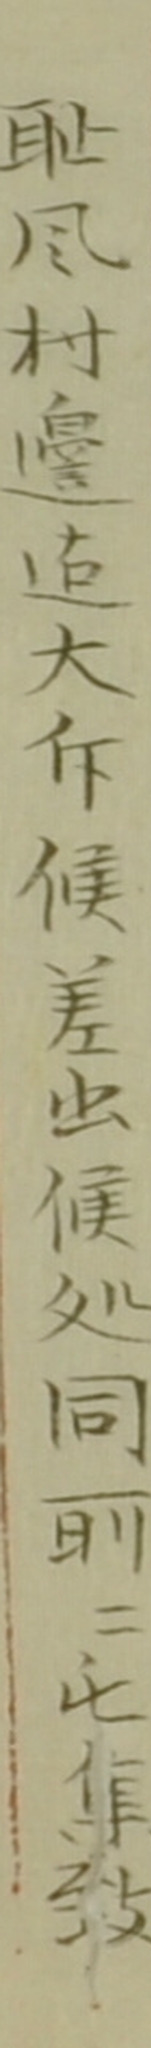恥風村辺迄大斥候差出候処同前ニ屯集致
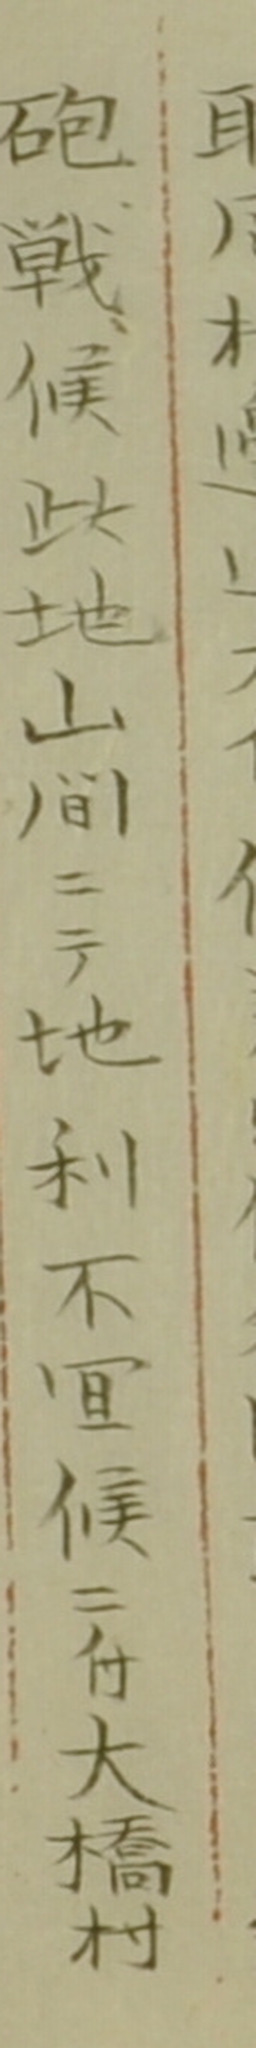砲戦候此地山間ニテ地利不宜候ニ付大橋村
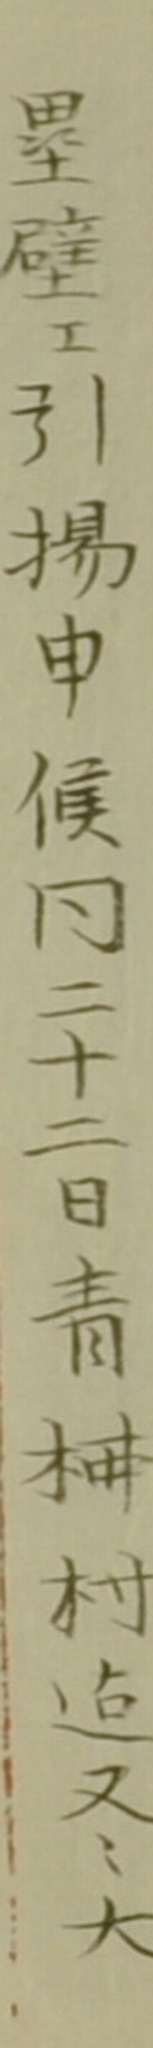塁壁エ引揚申候同二十二日青柳村迄又々大
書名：奥越出兵中戦争之事件概略抄録（控）
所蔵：伊那市立高遠町図書館・合同会社AMANE
